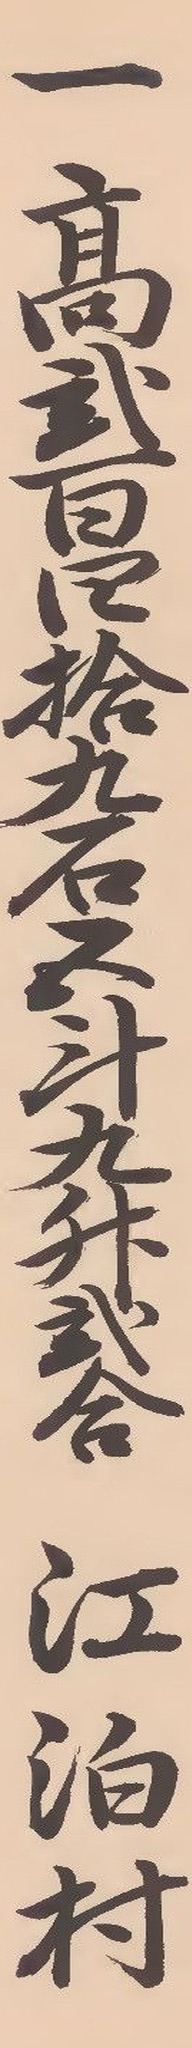一高弐百四拾九石五斗九升弐合江泊村
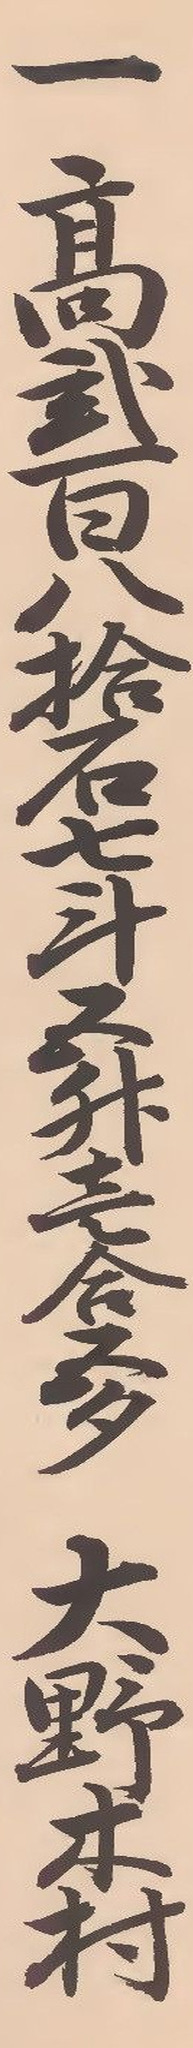一高弐百八拾石七斗五升壱合五勺大野木村
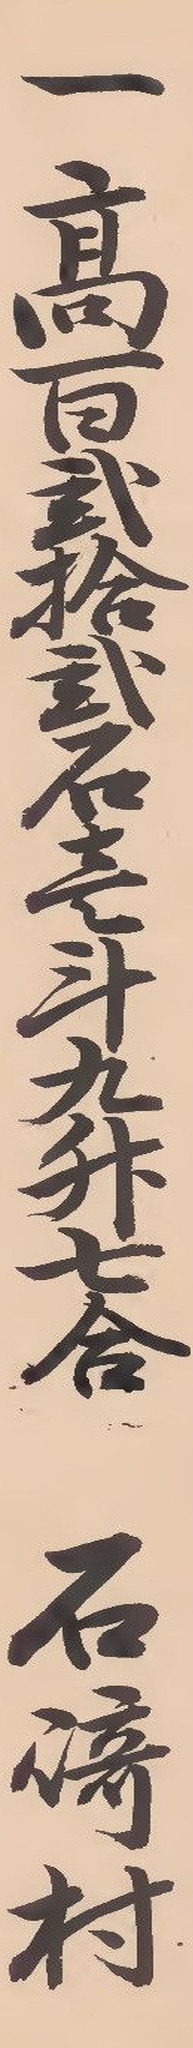一高百弐拾弐石壱斗九升七合石崎村

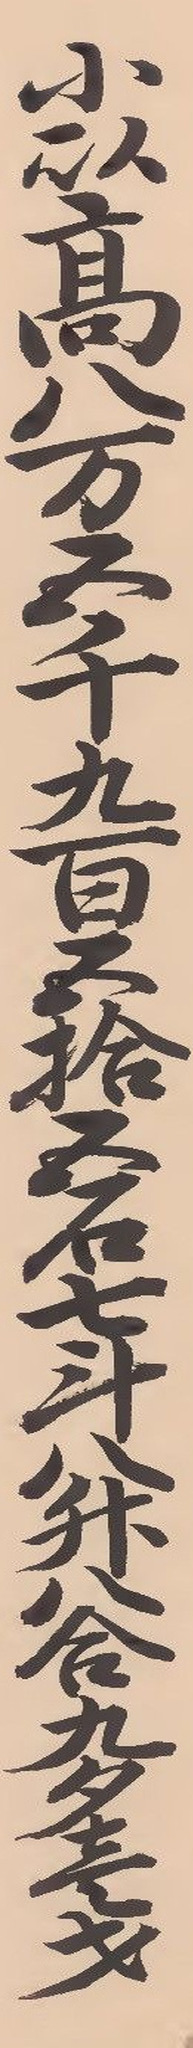小以高八万五千九百五拾五石七斗八升八合九勺壱才
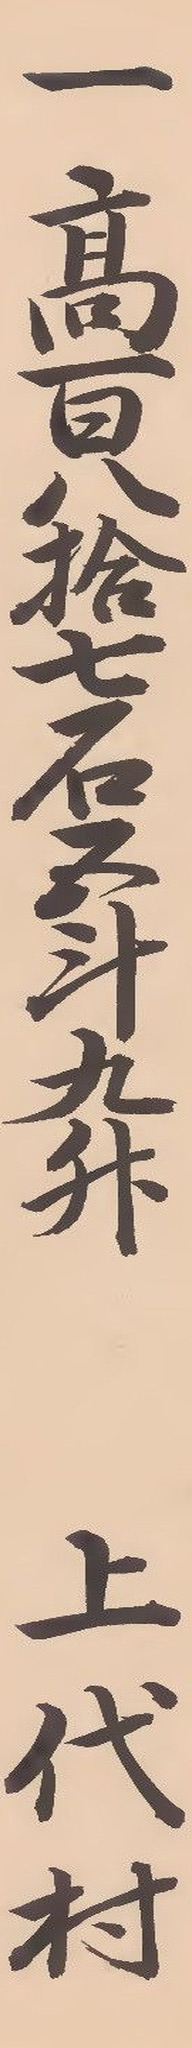一高百八拾七石五斗九升上代村
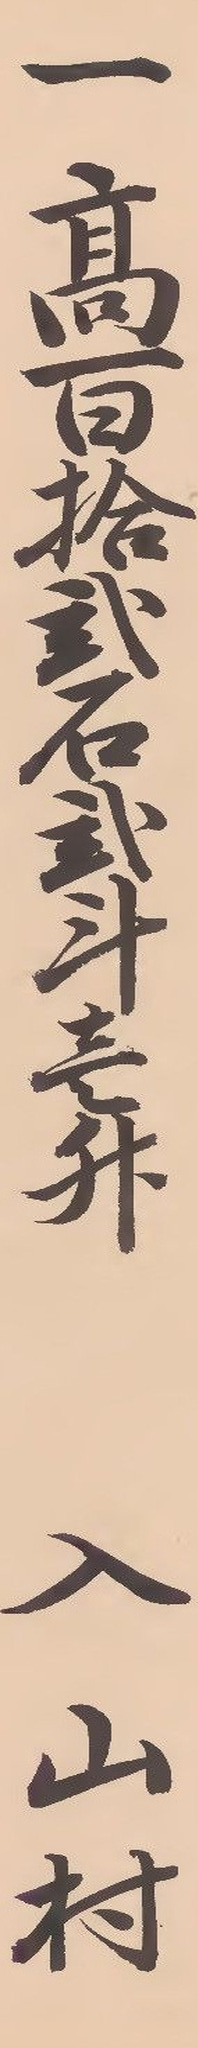一高百拾弐石弐斗壱升入山村
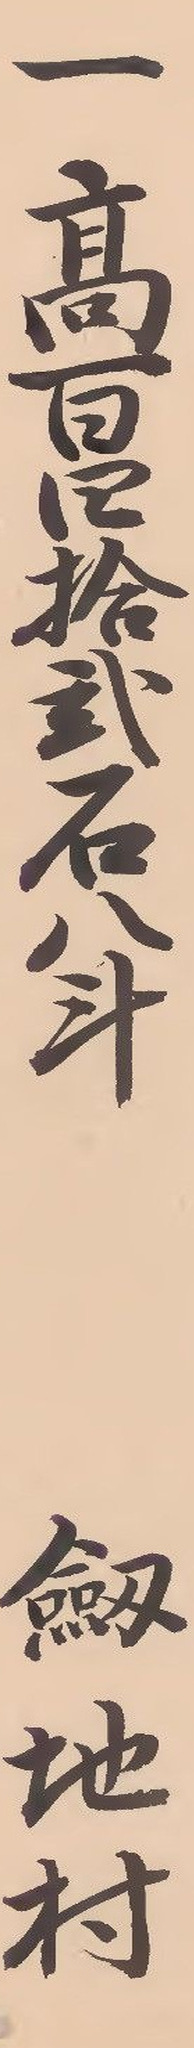一高百四拾弐石八斗剣地村

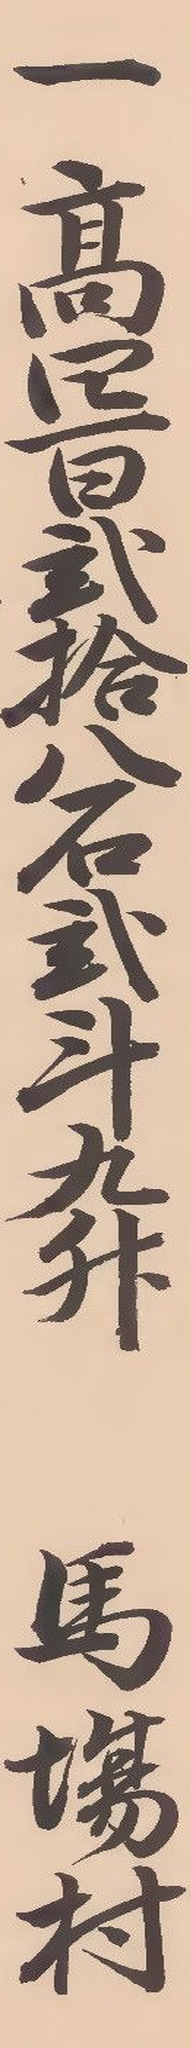一高四百弐拾八石弐斗九升馬場村
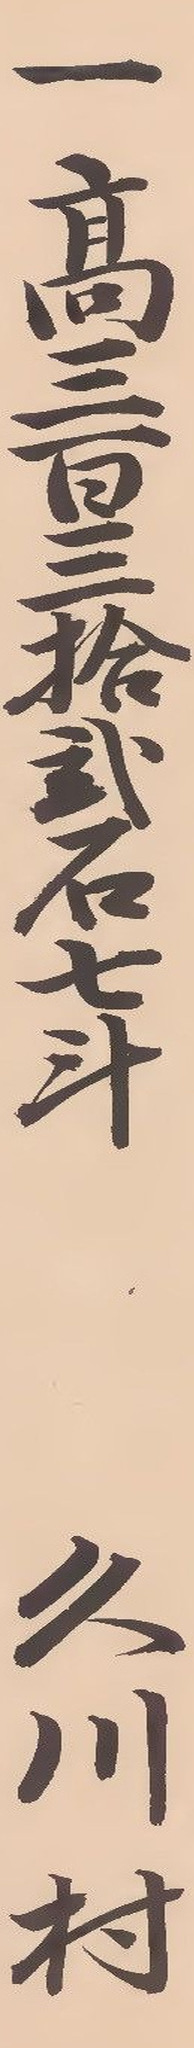一高三百三拾弐石七斗久川村
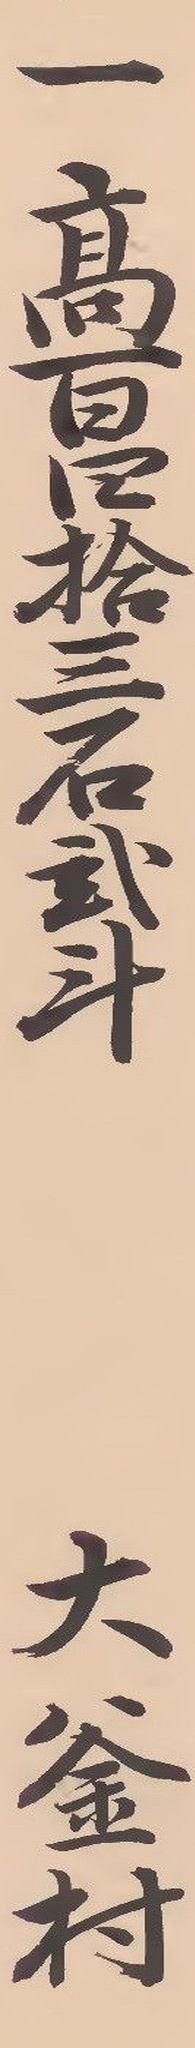一高百四拾三石弐斗大釜村
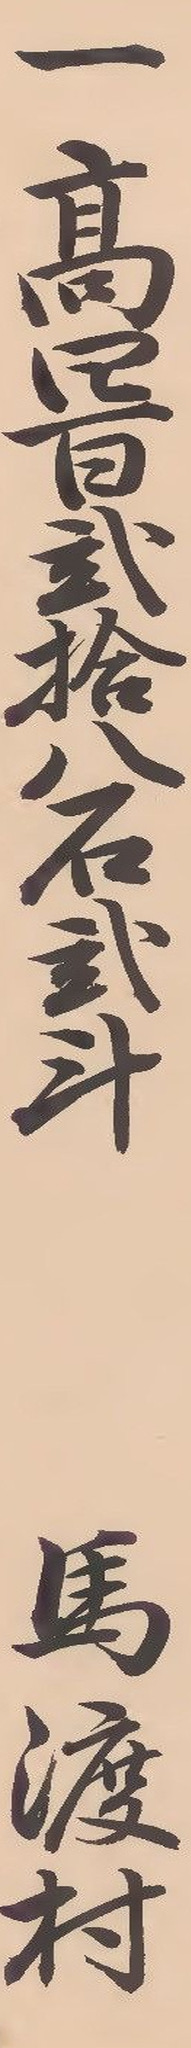一高四百弐拾八石弐斗馬渡村

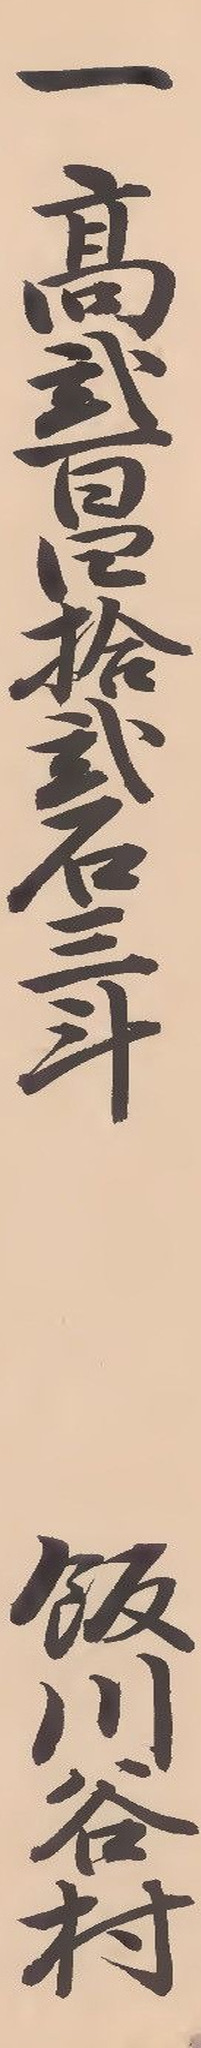一高弐百四拾弐石三斗飯川谷村
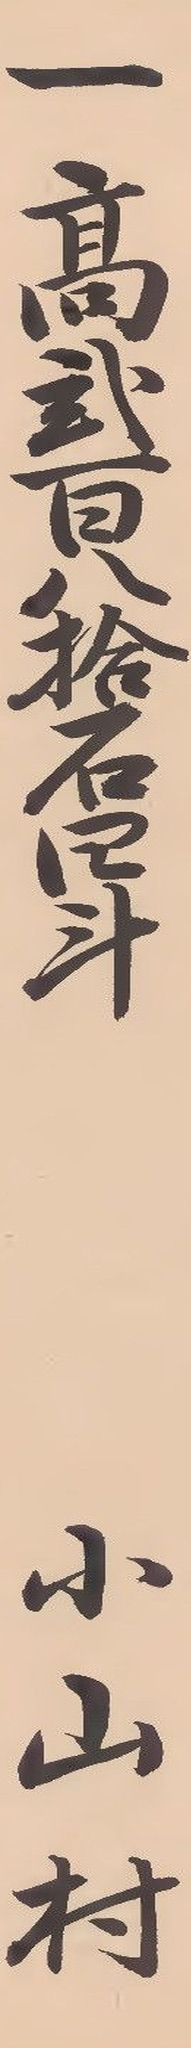一高弐百八拾石四斗小山村
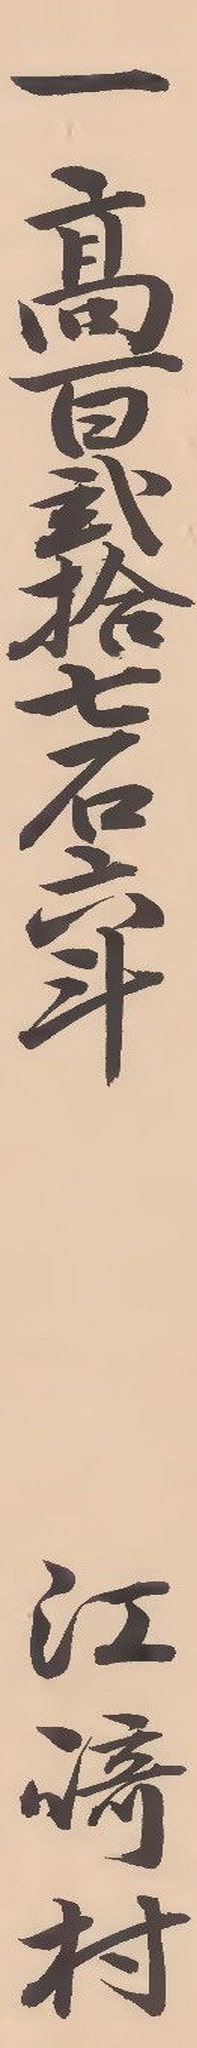一高百弐拾七石六斗江崎村
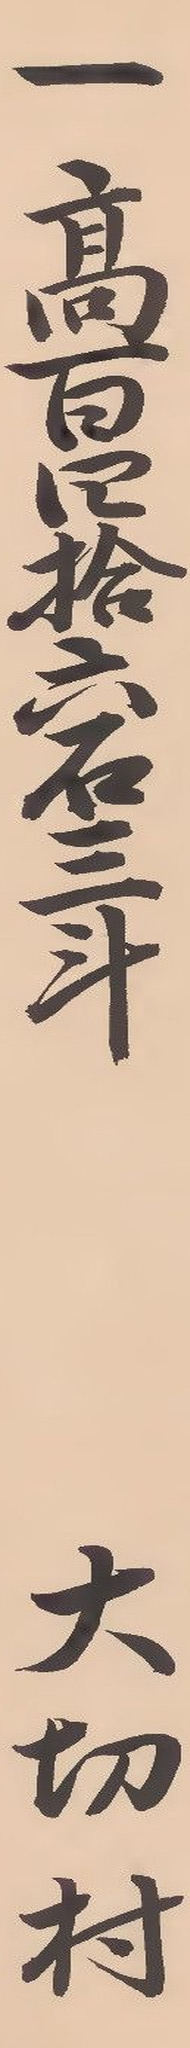一高百四拾六石三斗大切村
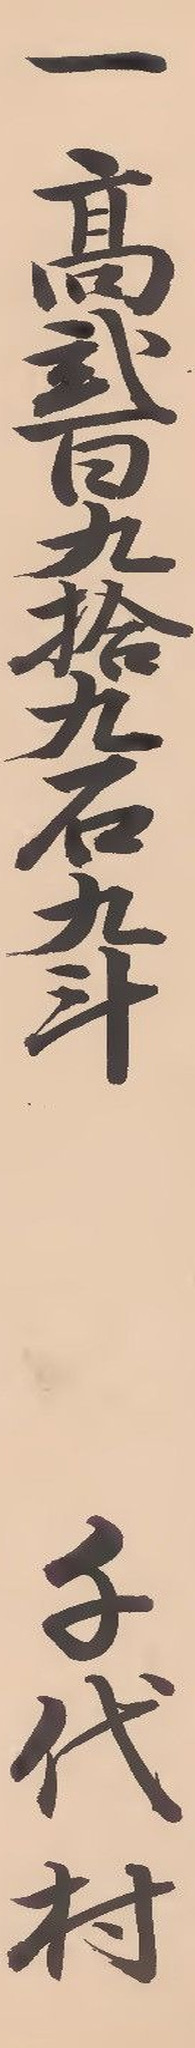一高弐百九拾九石九斗千代村
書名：能登国郷帳
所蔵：国立公文書館 National Archives of Japan
